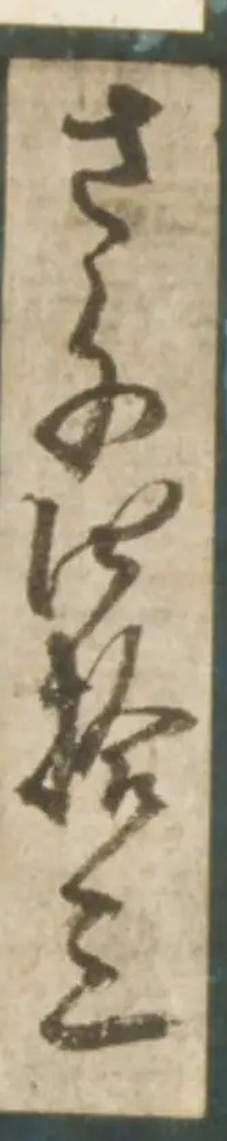さ千四拾三

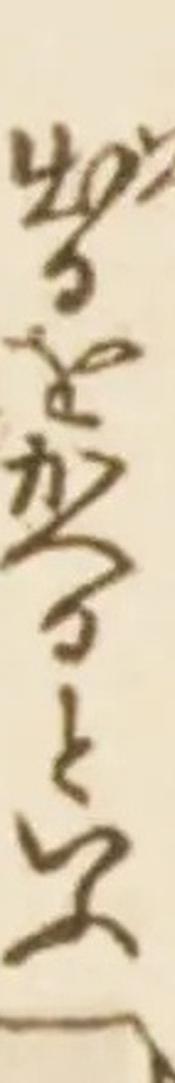出るをかへるといふ
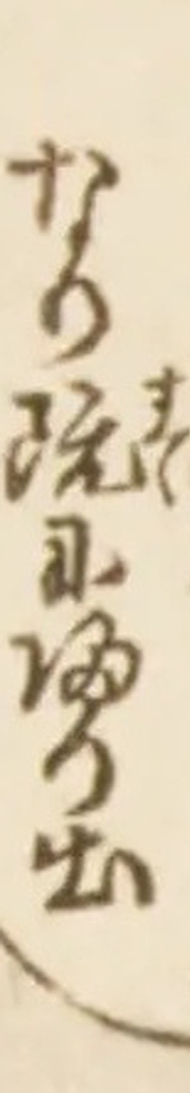なり既に帰り出
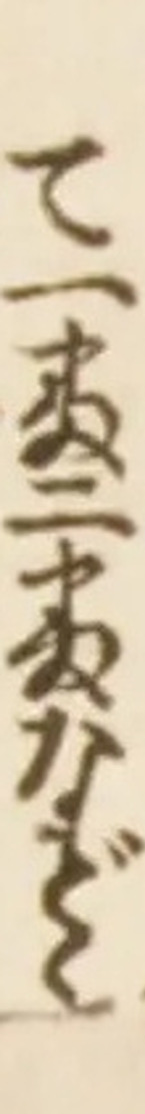て一番二番などゝ
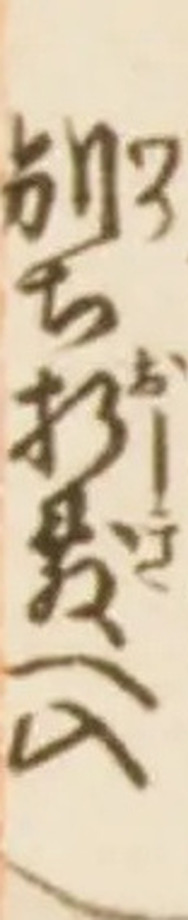別ち折敷へ入
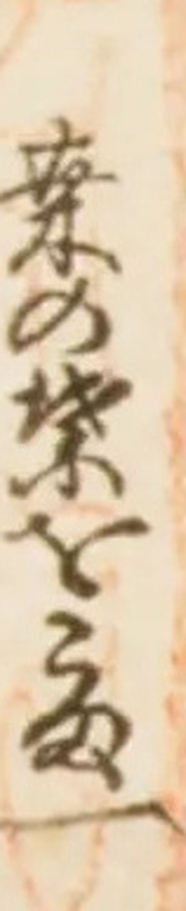桑の葉をこま
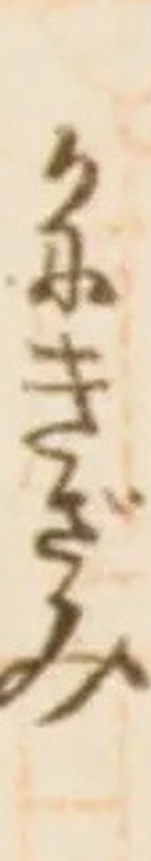かにきざみ

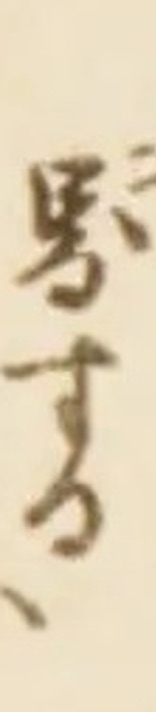図するは
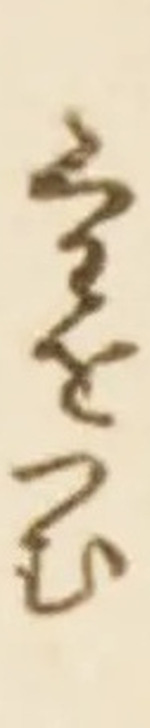くわをつむ
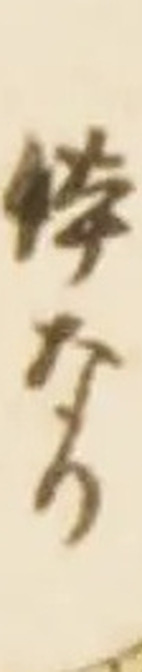体なり
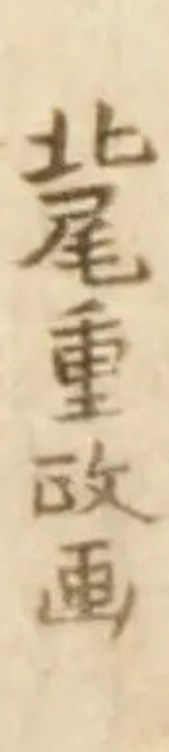北尾重政画
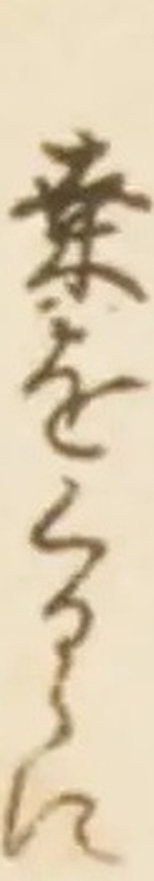桑をくるゝに
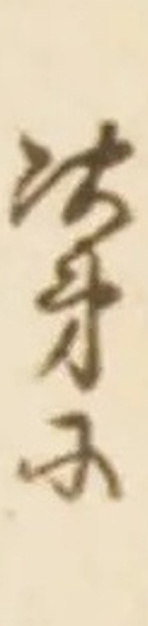次第に
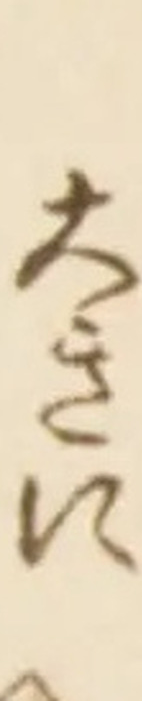大きに
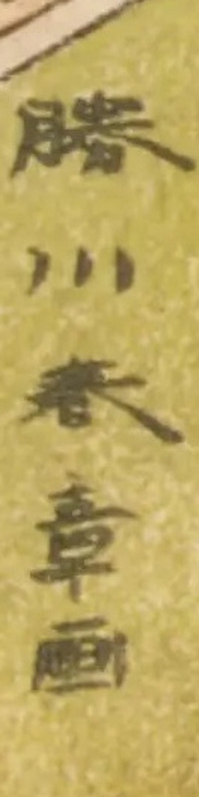勝川春章画

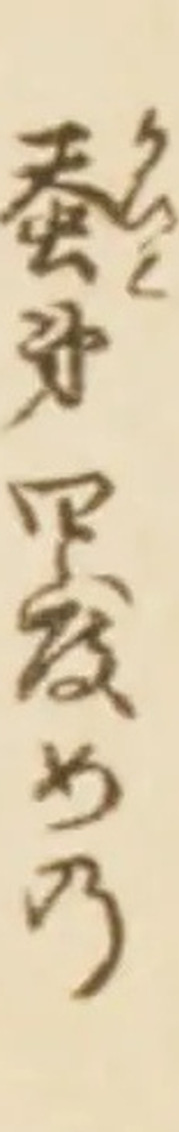蚕第四度めの
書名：画本宝能縷
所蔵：国立国会図書館 National Diet Library, JAPAN
